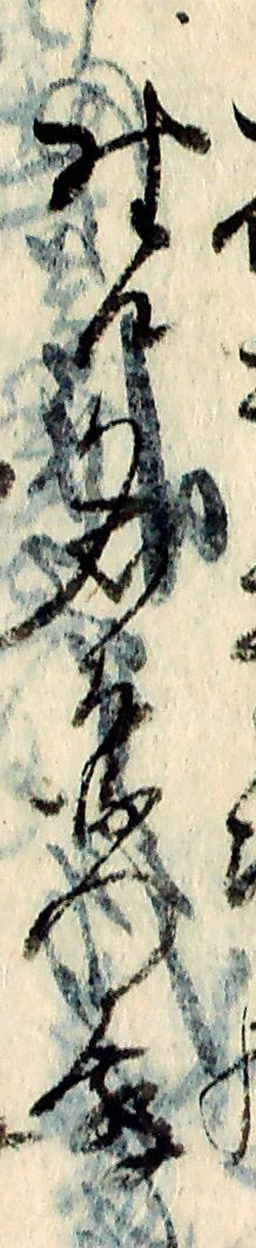野口名左衛門殿
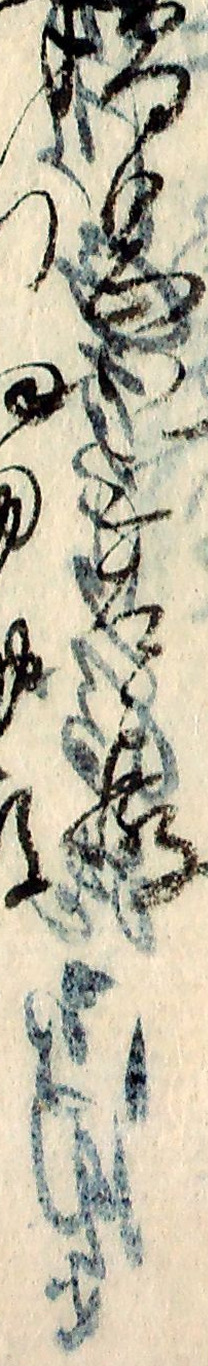高岡小三太殿
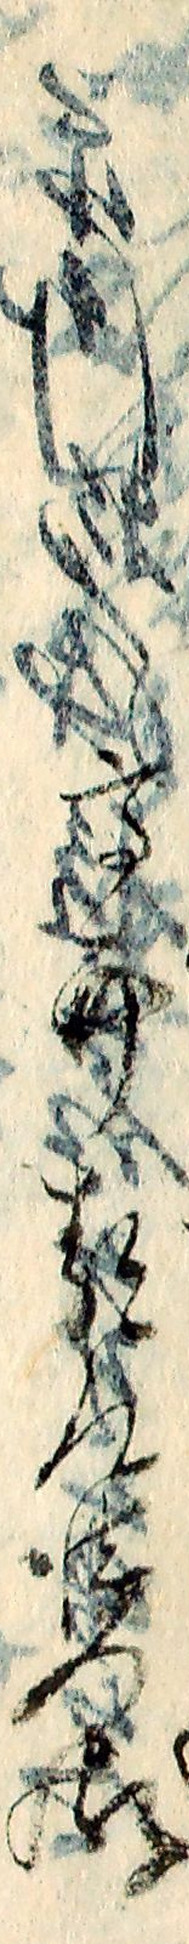高井類左衛門殿

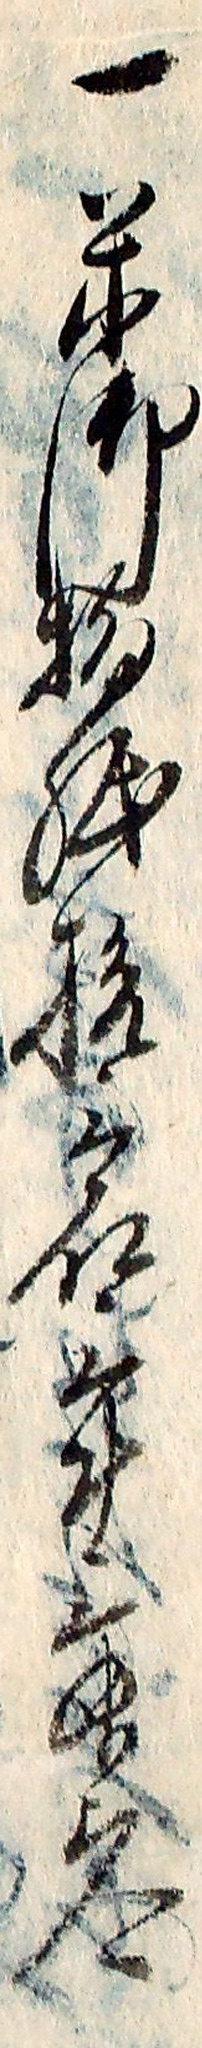一米御指紙拾三石三斗三升三合
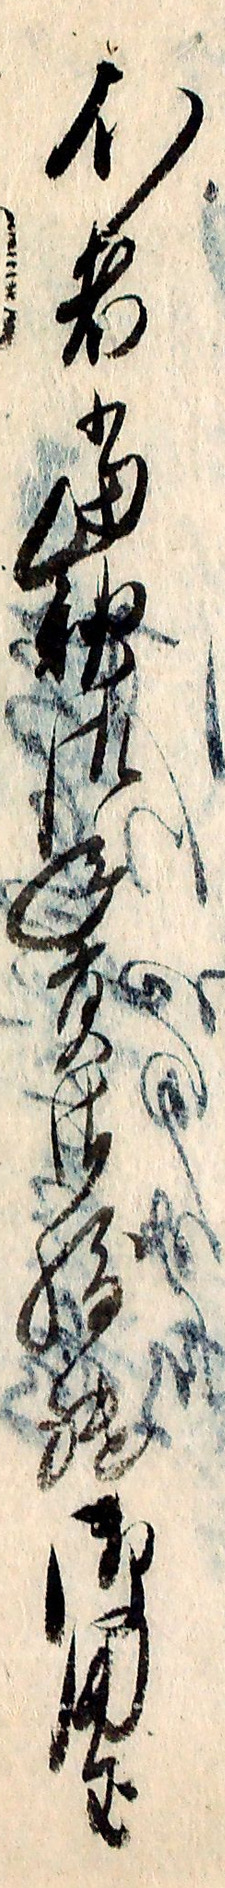右は当秋御年貢御指継御用金
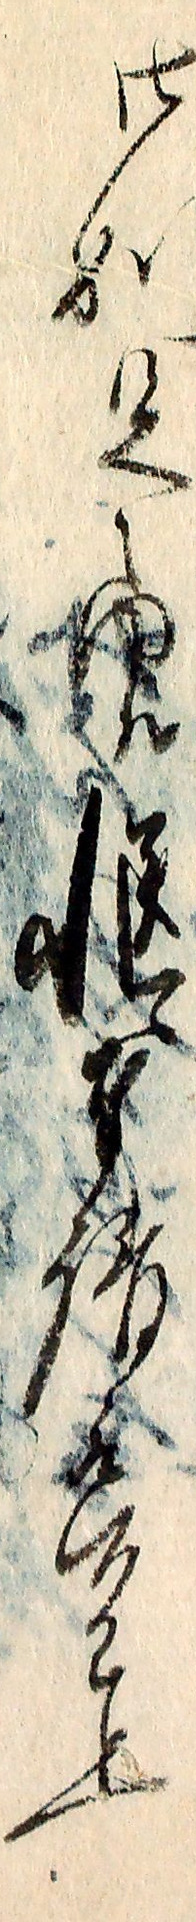御利足之内え慥に奉請取候已上
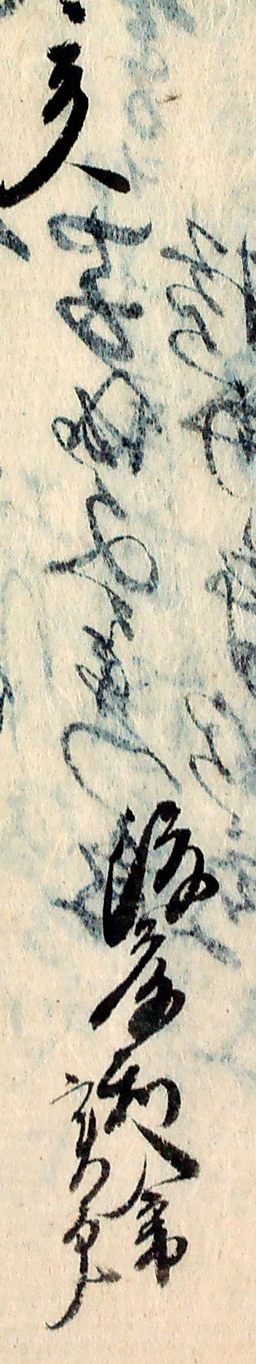後藤利八郎
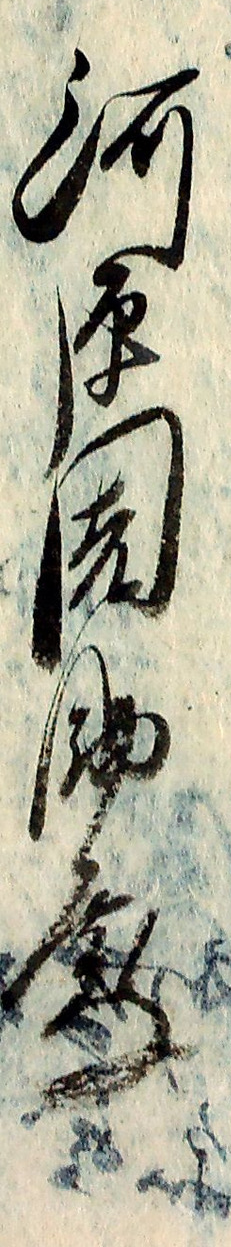河原周助殿

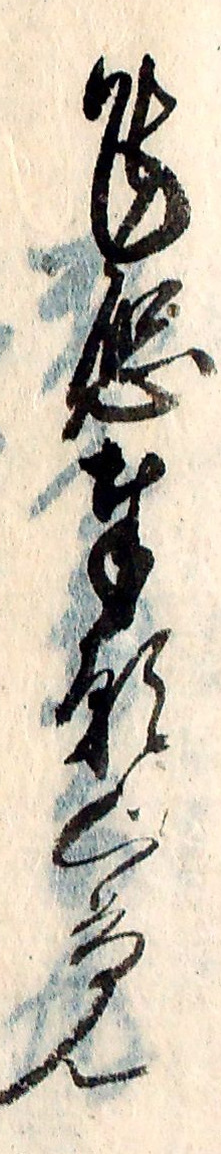乍恐奉願上覚
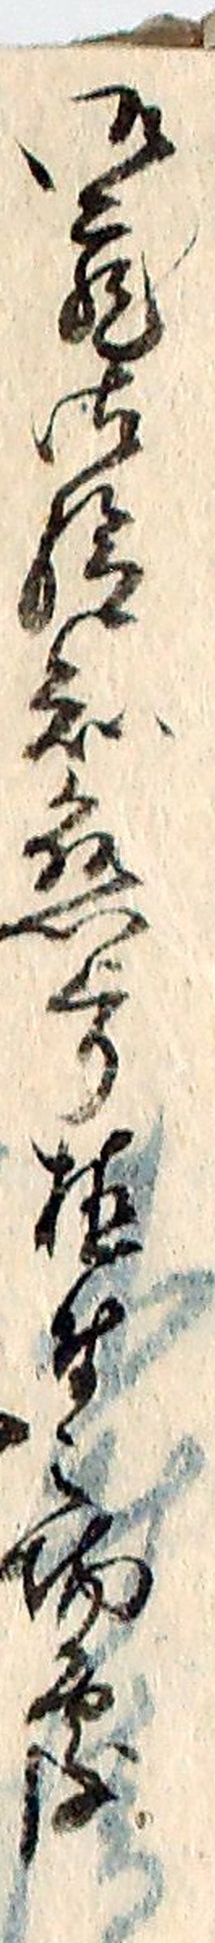御蔵御給知愈上り植付之場処
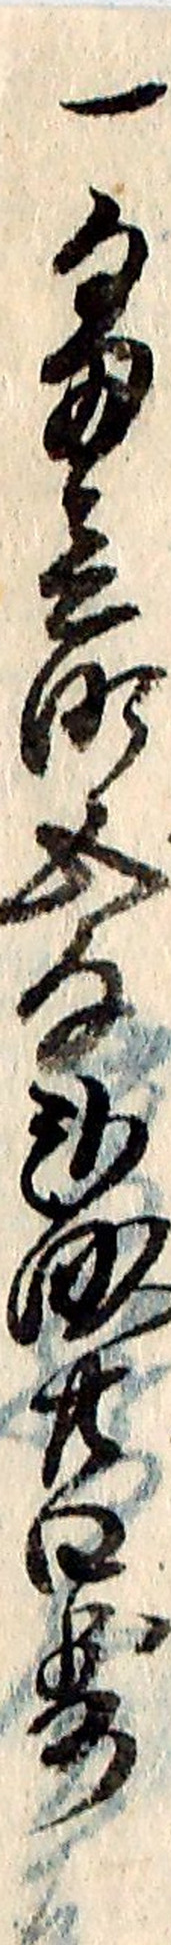一壱町五反弐畝廿四歩
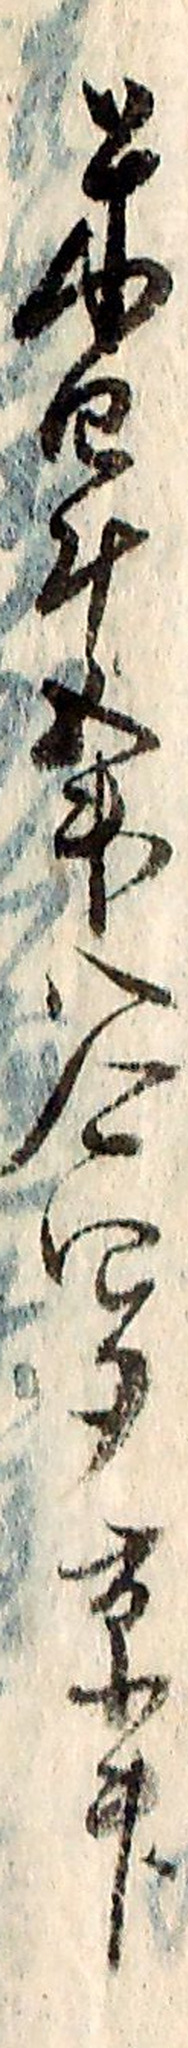米四斗五升八合四勺京舛
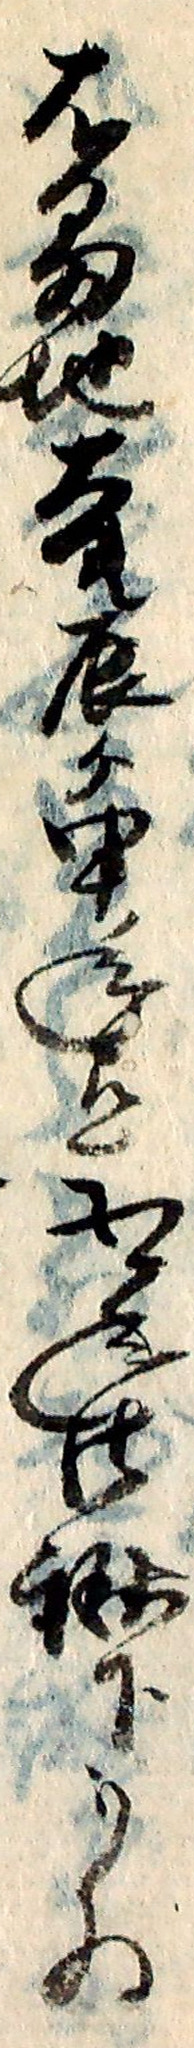右畠地去る辰ゟ申の年迄五ヶ年御鍬下被為
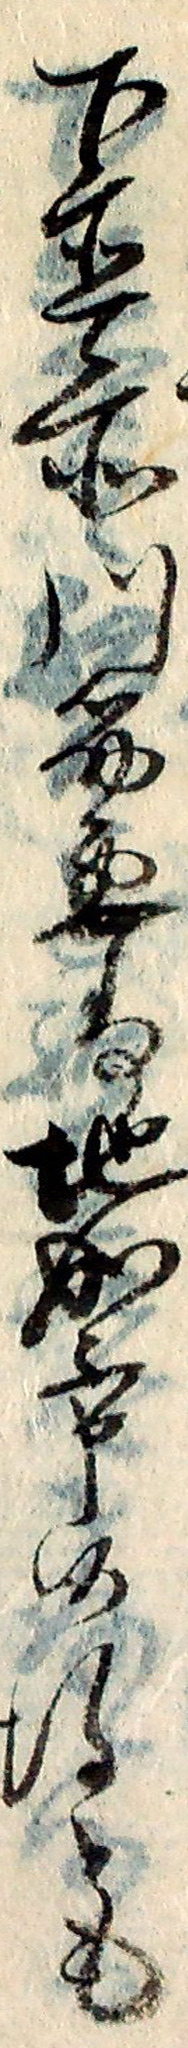下置候所川筋悪布地成不申候得とも
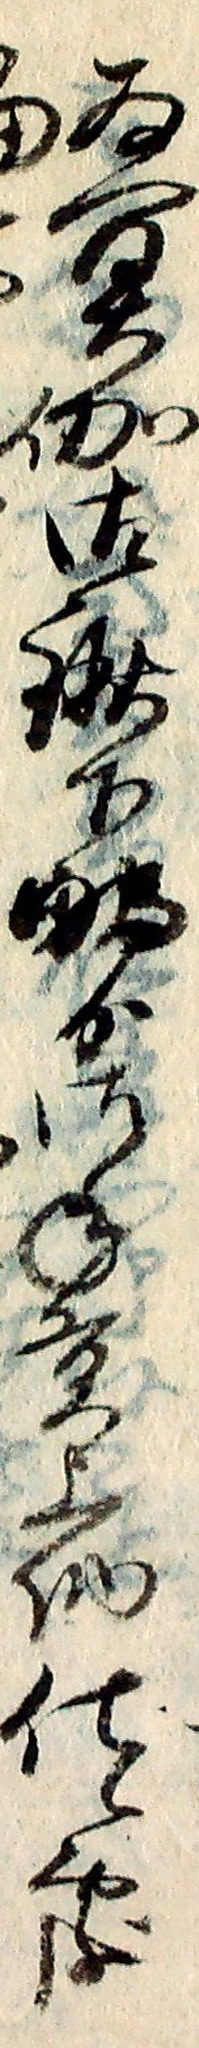為冥伽御鍬下明ゟ御年貢上納仕候処
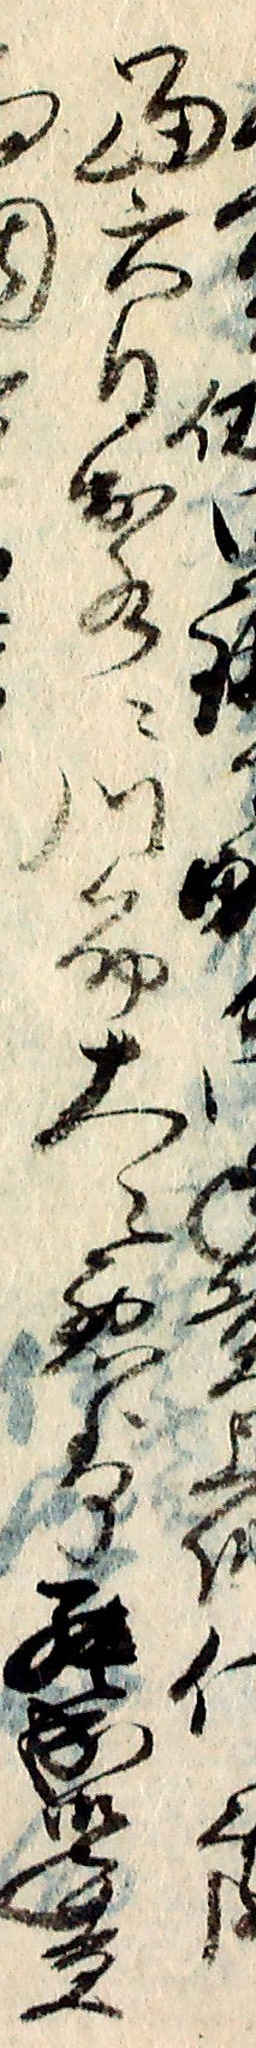当六月出水に川筋大に悪布罷成御年貢
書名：諸御願書控(後藤氏壱番）
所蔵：鳴門教育大学 Naruto University of Education
